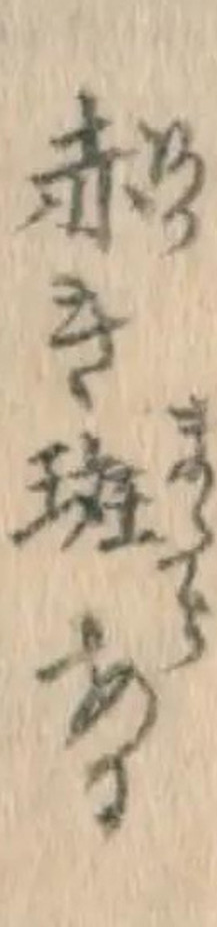赤き斑ある

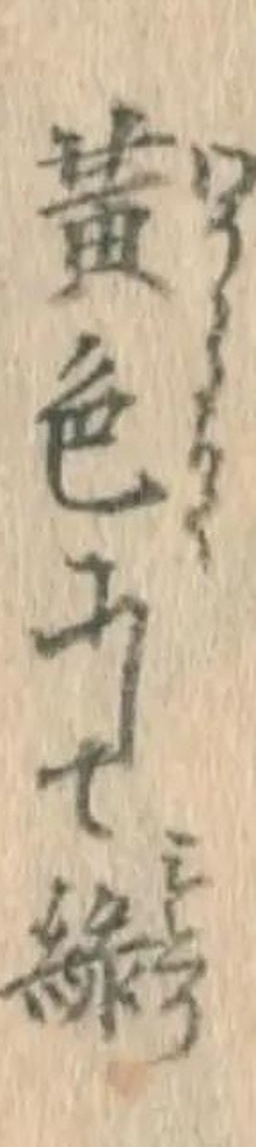黄色にして緑
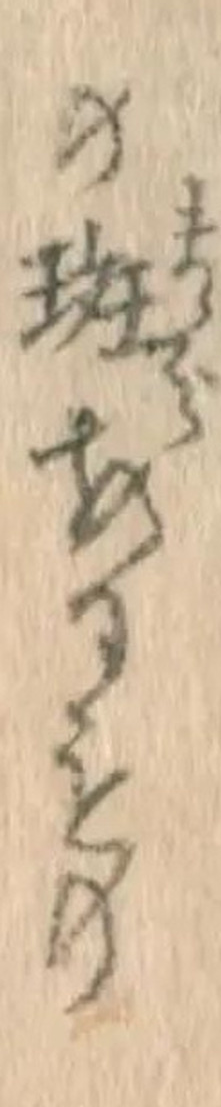の斑あるもの
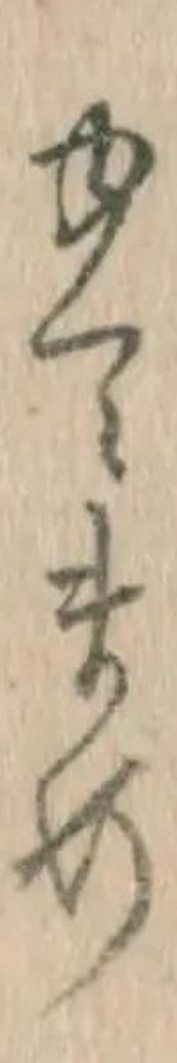ゆてまめ
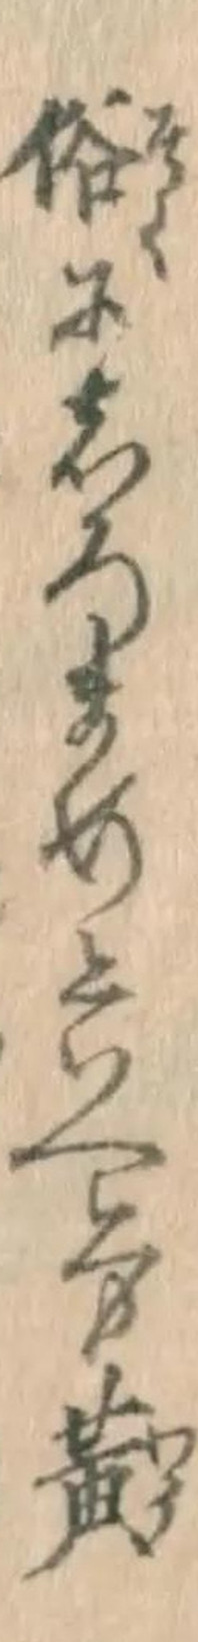俗にしろまめといへとも黄
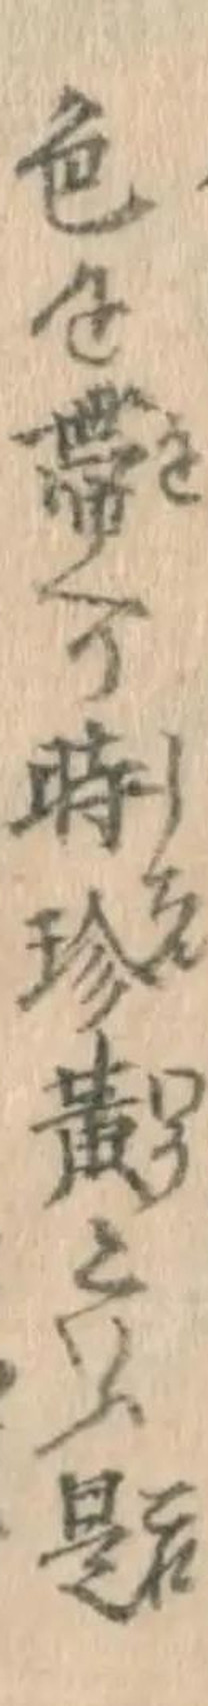色を帯へり時珍黄といふ是
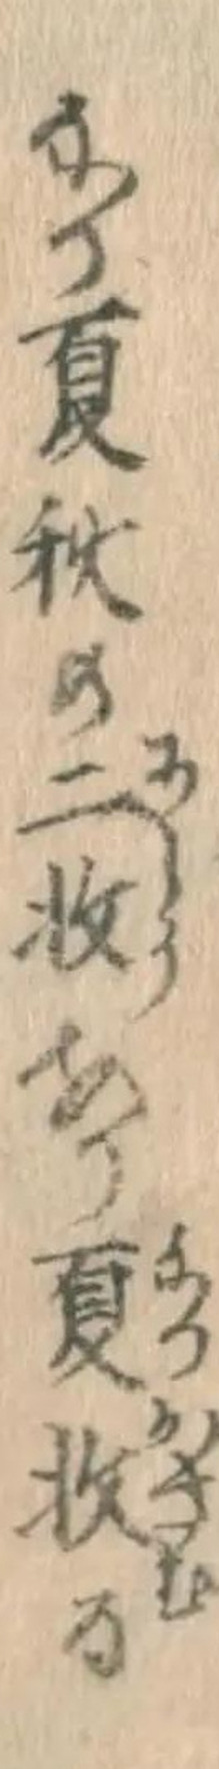なり夏秋の二収あり夏収る
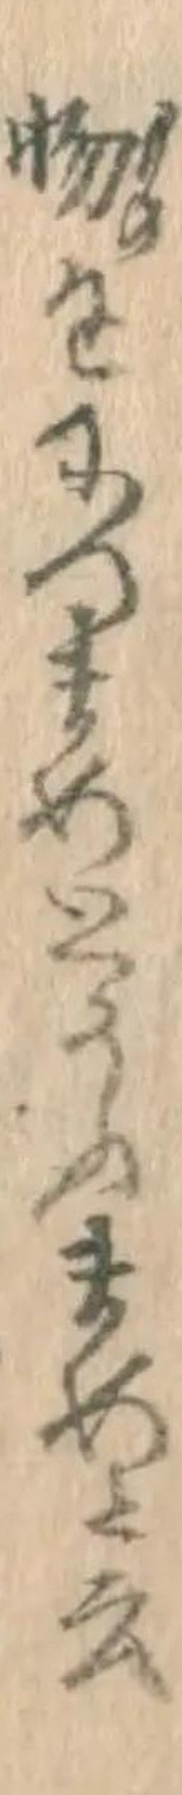物をなつまめとうふまめと云
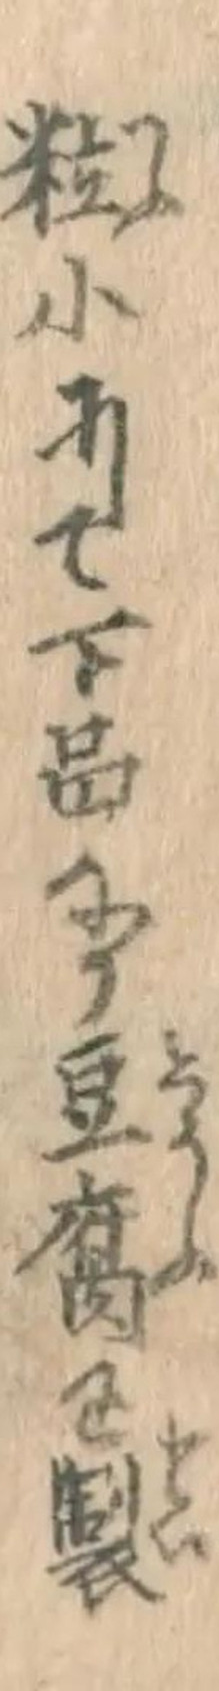粒小にして下品なり豆腐を製
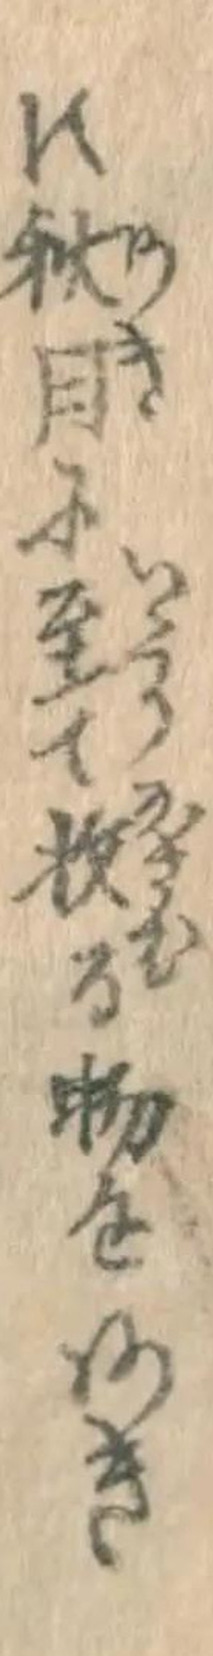す秋月に至て収る物をあき
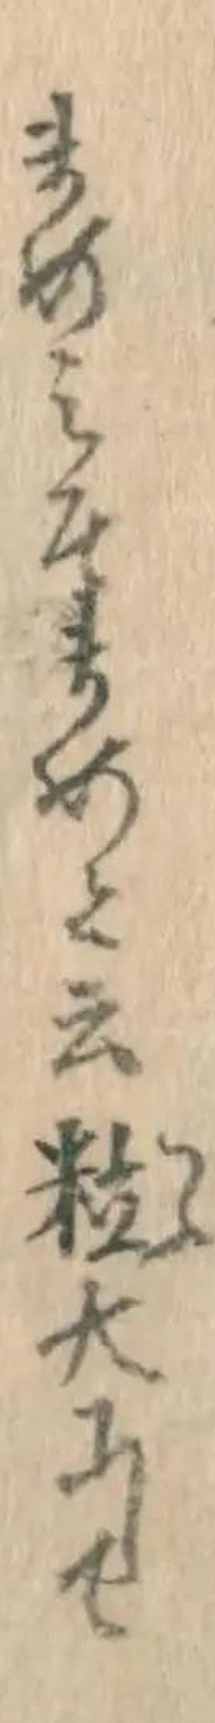まめみそまめと云粒大にして
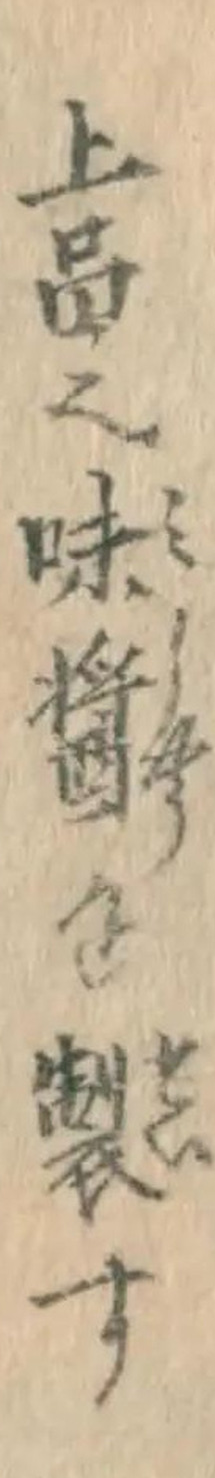上品也味醤を製す

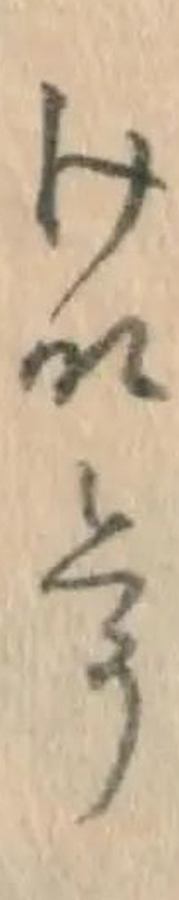けいとう
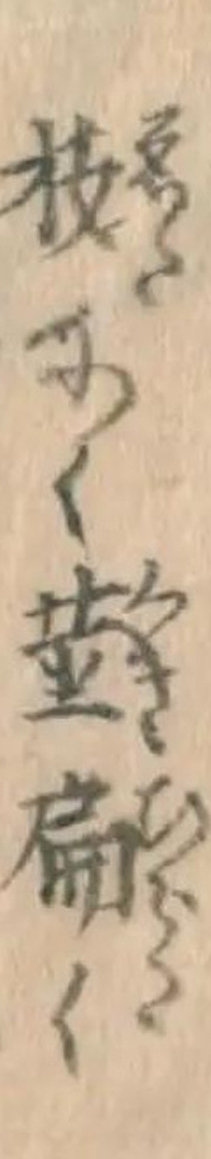枝なく茎扁く
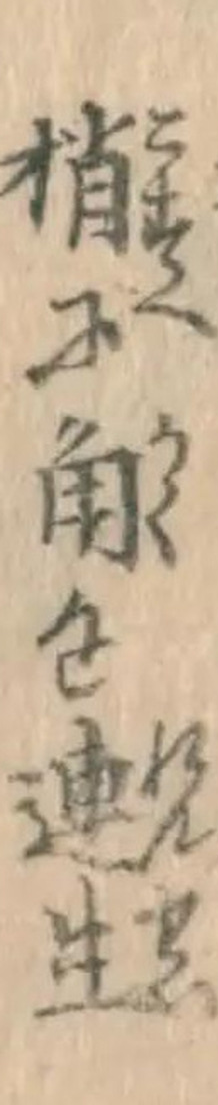梢に角を連生

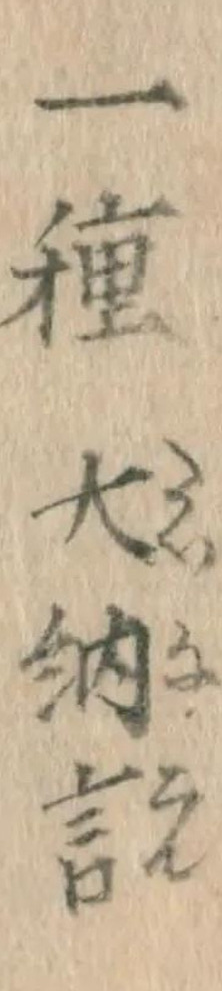一種大納言
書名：本草図譜. 巻43-45
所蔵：国立国会図書館 National Diet Library, JAPAN
